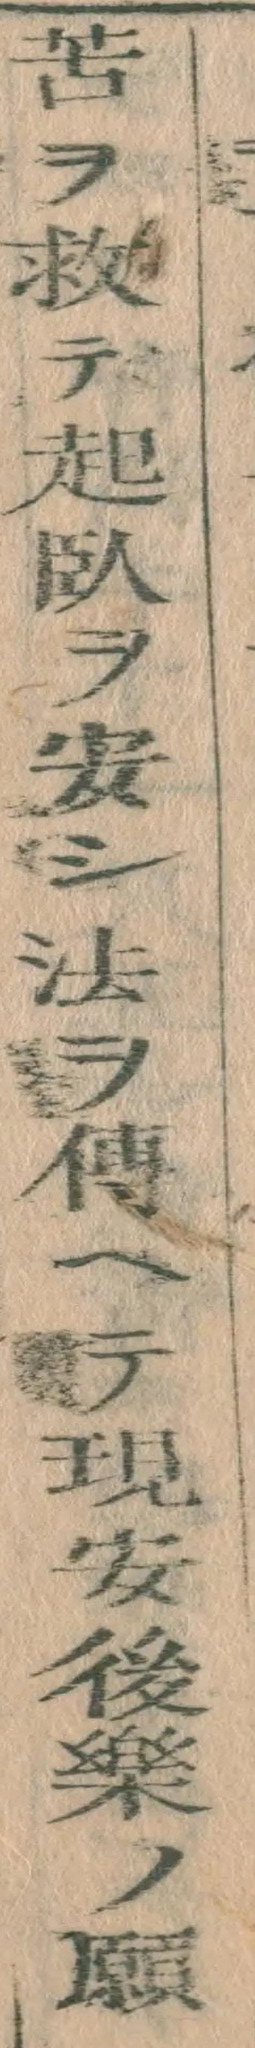苦ヲ救テ起臥ヲ安シ法ヲ伝ヘテ現安後楽ノ願
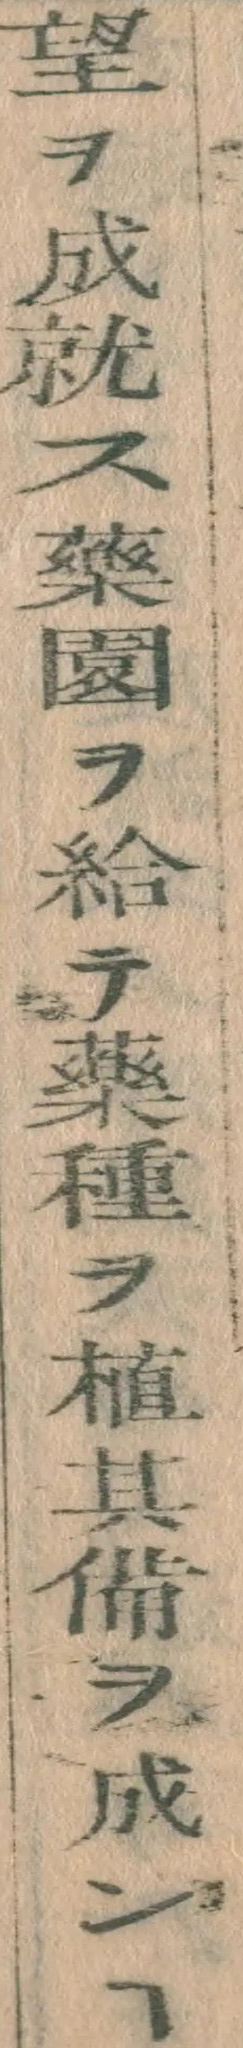望ヲ成就ス薬園ヲ給テ薬種ヲ植其備ヲ成ンヿ
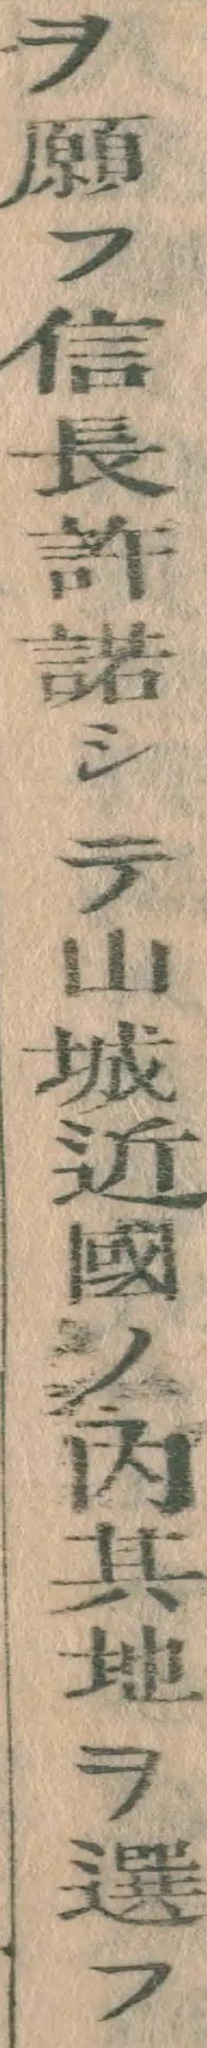ヲ願フ信長許諾シテ山城近国ノ内其地ヲ選フ
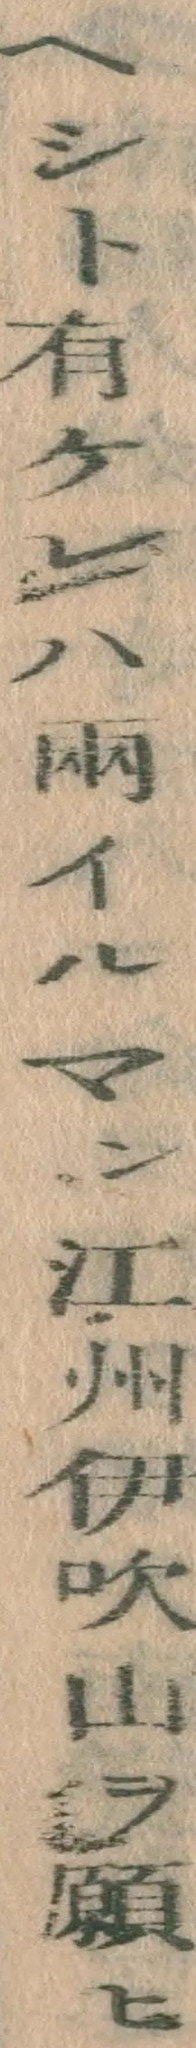ヘシト有ケレハ両イルマン江州伊吹山ヲ願ヒ
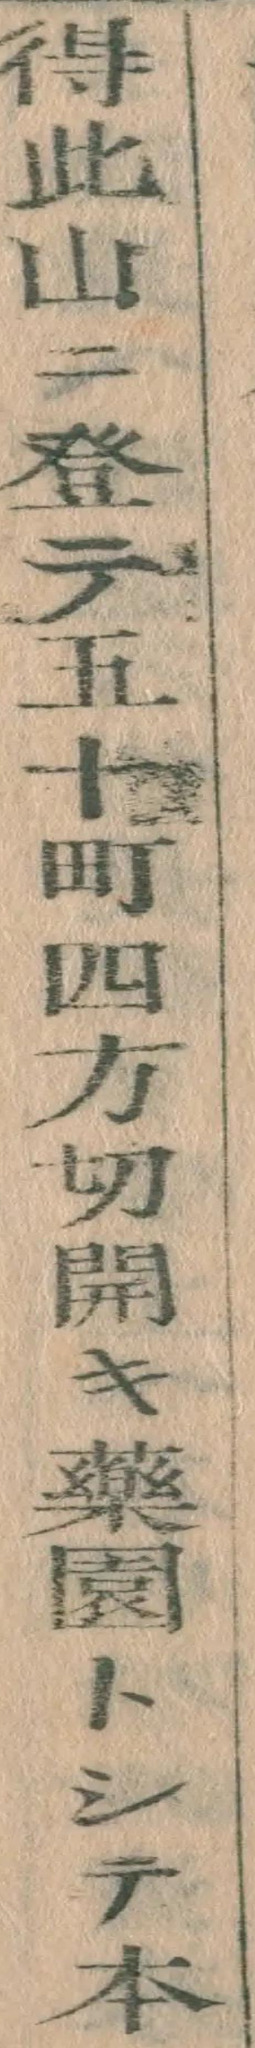得此山ニ登テ五十町四方切開キ薬園トシテ本
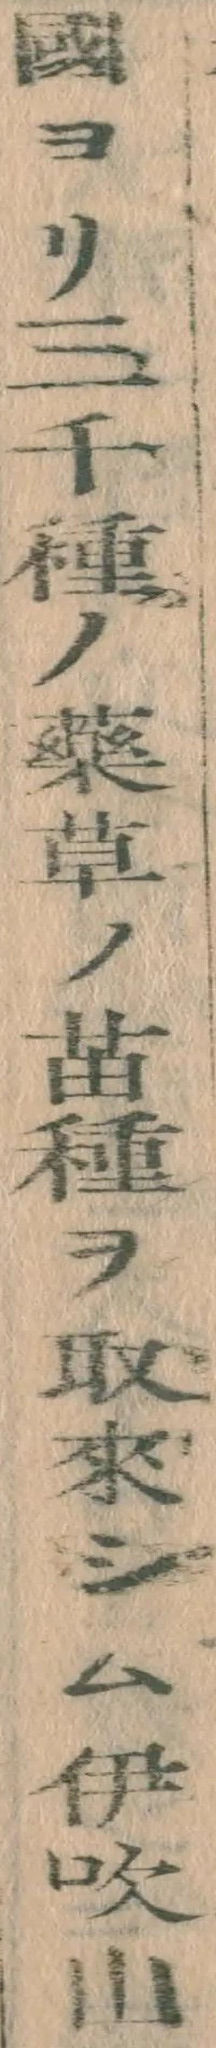国ヨリ三千種ノ薬草ノ苗種ヲ取来シム伊吹山
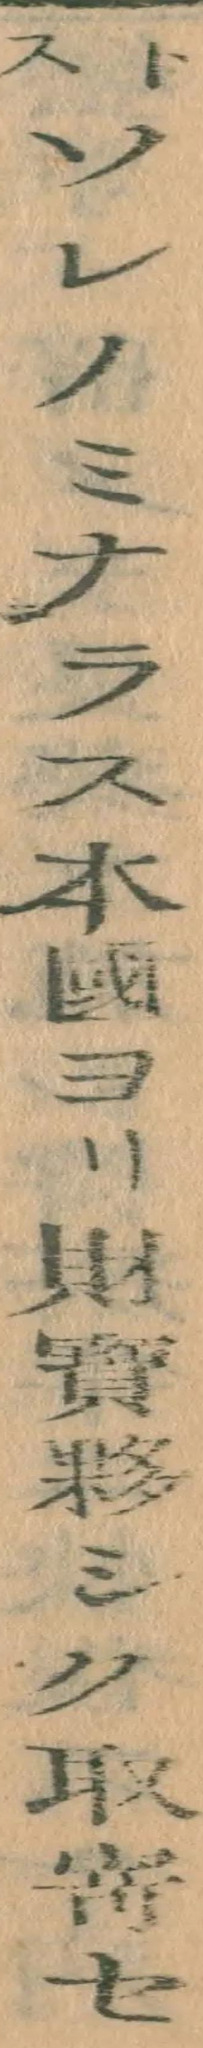トスソレノミナラス本国ヨリ財宝夥シク取寄セ
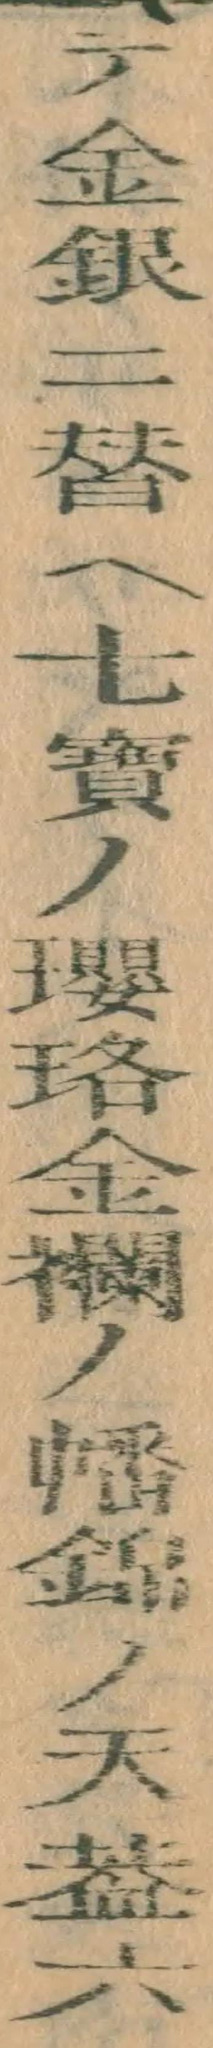テ金銀ニ替ヘ七宝ノ瓔珞金襴ノ幡錦ノ天蓋六
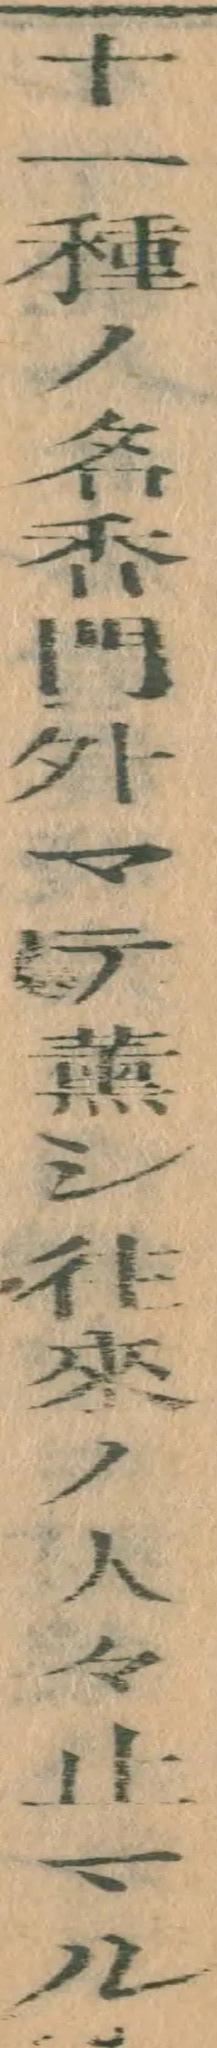十一種ノ名香門外マテ薫シ往来ノ人々止マル
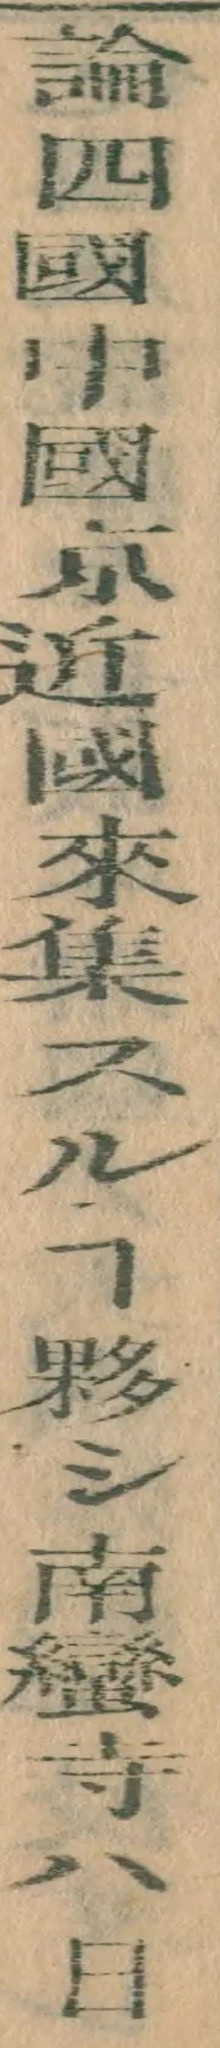論四国中国京近国来集スルヿ夥シ南蛮寺ハ日
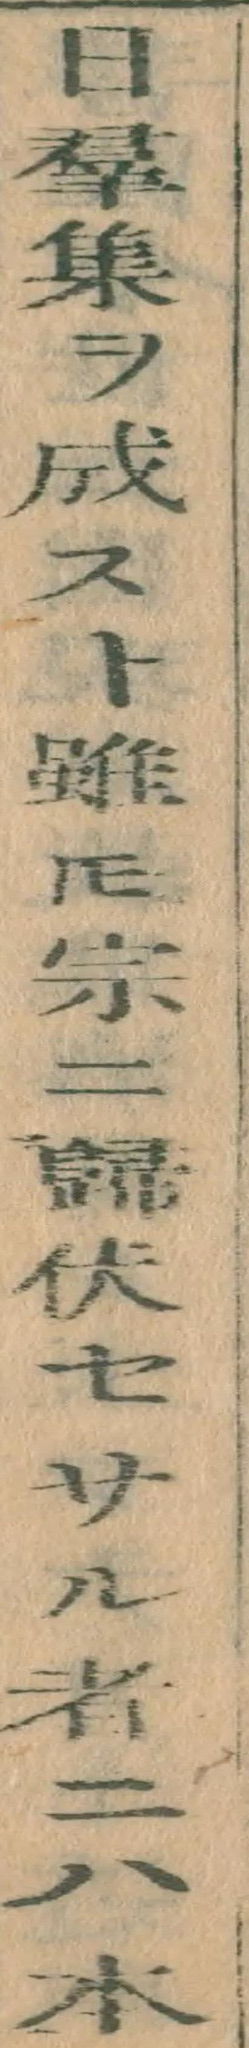日群集ヲ成スト雖トモ宗ニ帰伏セサル者ニハ本
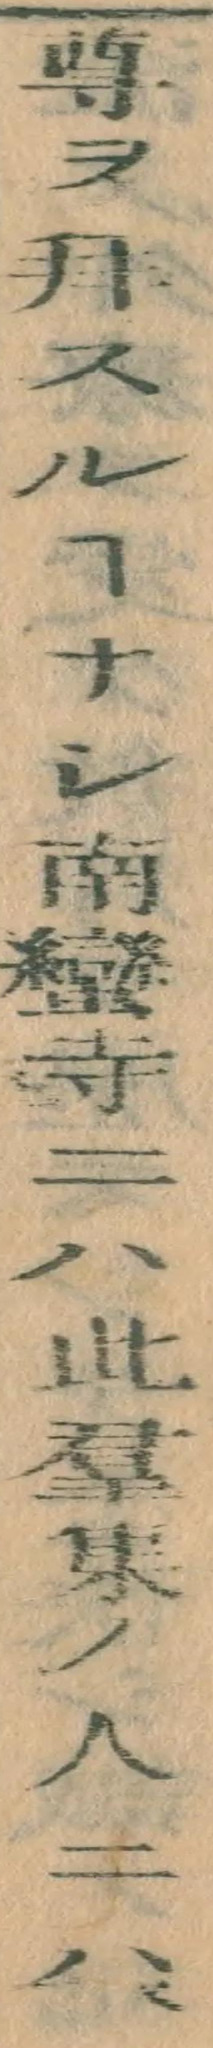尊ヲ拝スルヿナシ南蛮寺ニハ此群集ノ人ニハ
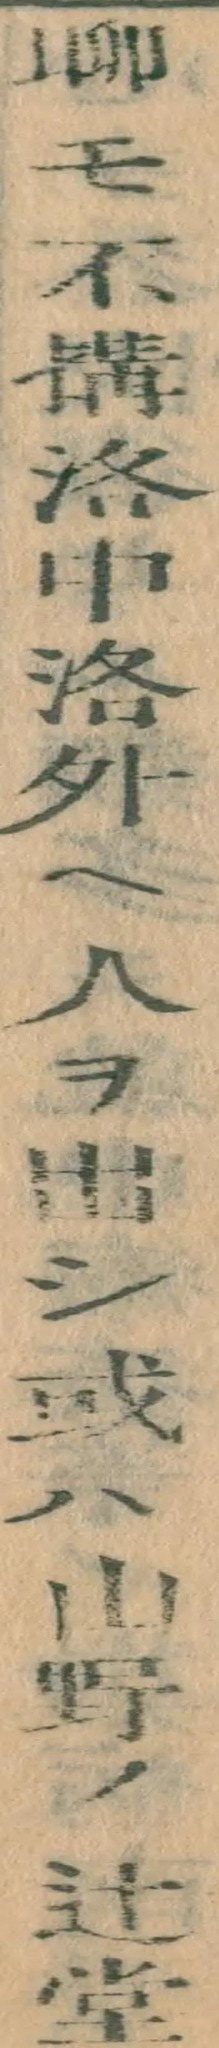聊モ不搆洛中洛外ヘ人ヲ出シ或ハ山野ノ辻堂
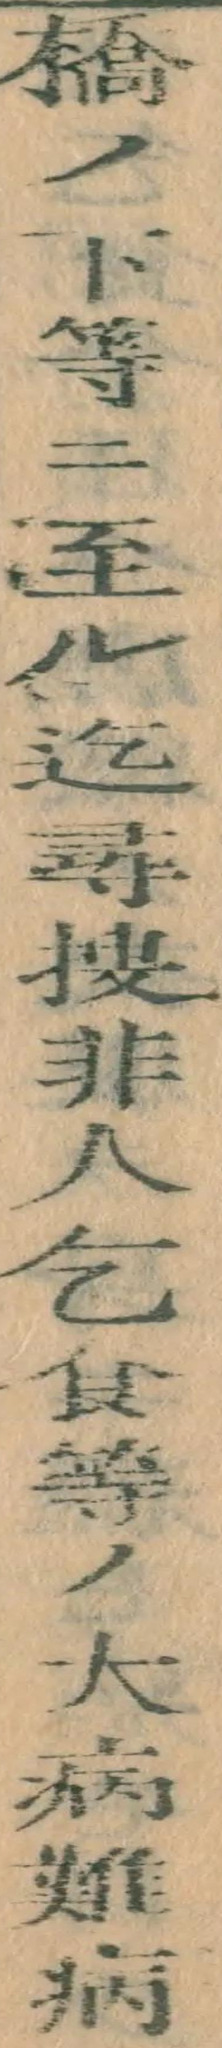橋ノ下等ニ至ル迄尋捜非人乞食等ノ大病難病
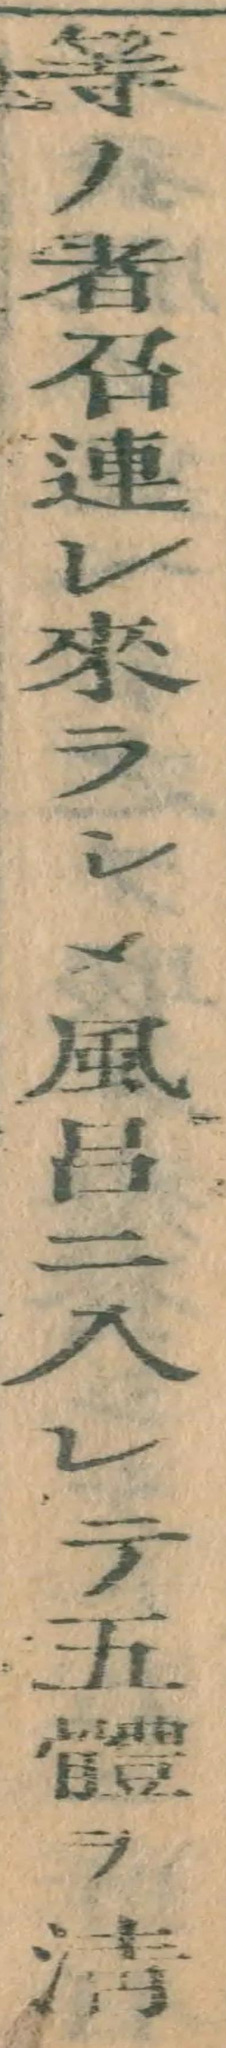等ノ者召連レ来ラシメ風呂ニ入レテ五体ヲ清

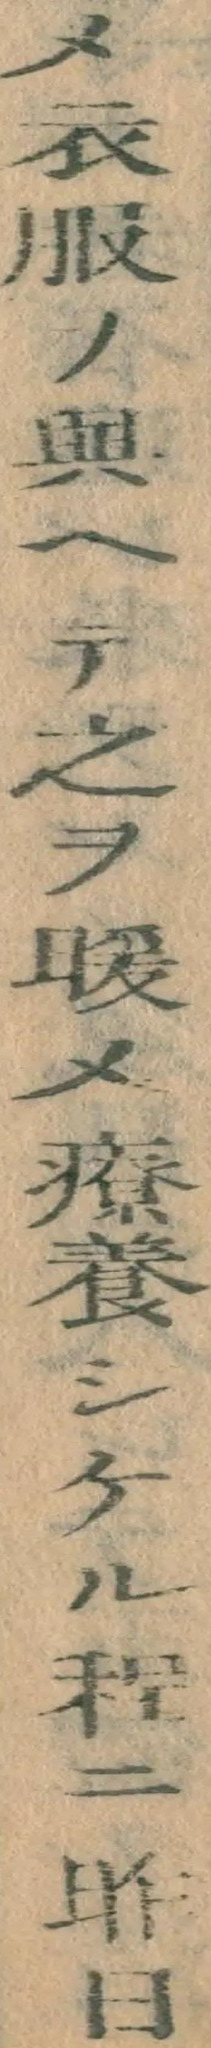メ衣服ノ与ヘテ之ヲ暖メ療養シケル程ニ昨日
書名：南蛮寺興廃記
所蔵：国立国会図書館 National Diet Library, JAPAN
